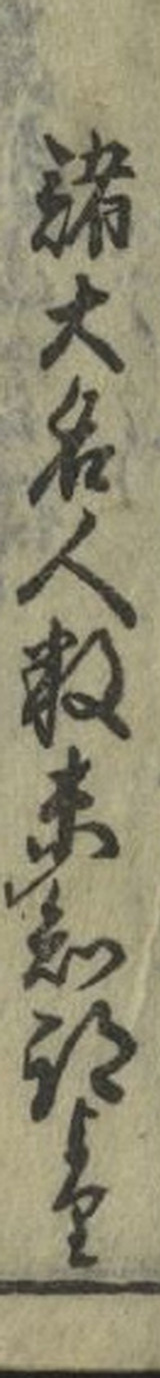諸大名人数未知跡より
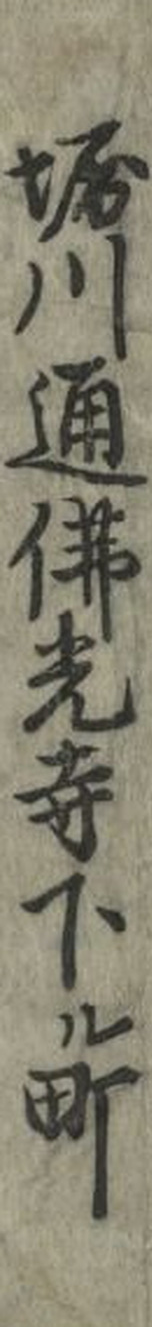堀川通佛光寺下る町
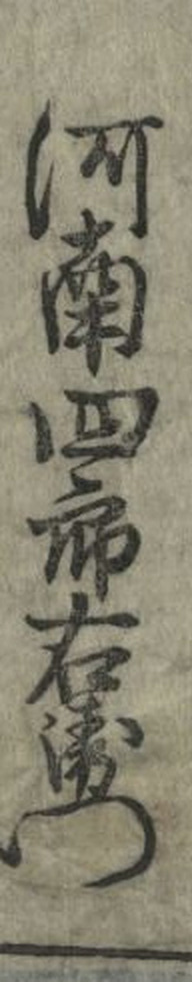河南四郎右衛門
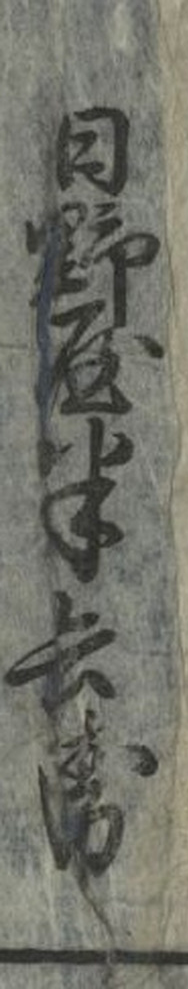日野屋半兵衛
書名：琉球人大行列記
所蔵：University of the Ryukyus Library
